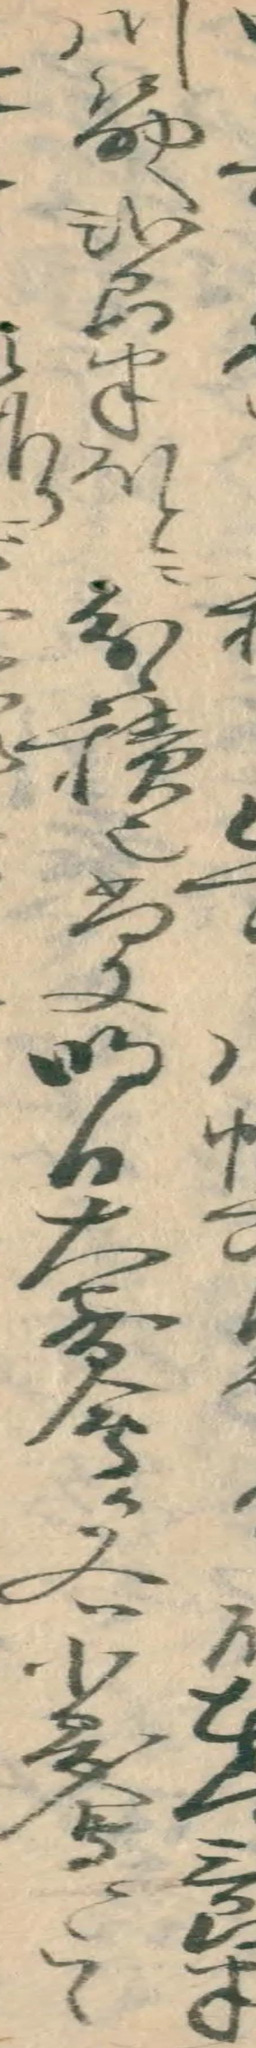川筋へ弐間半ほとニ分候積也尚又明日大寄会か又ハ小寄会ニ候ハヽ
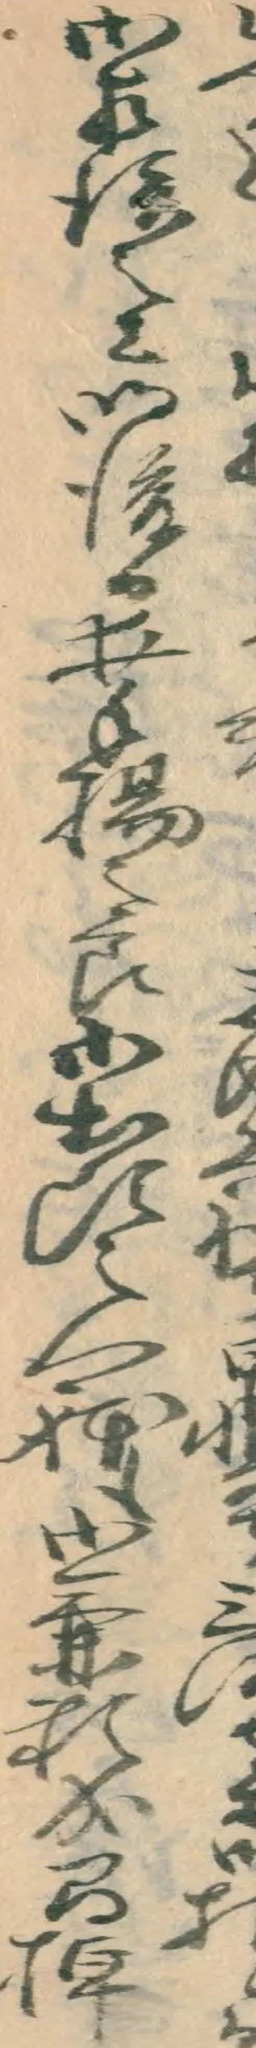御相談之上明後日井手揚之節御出頭之人体も御兼頼成間棹

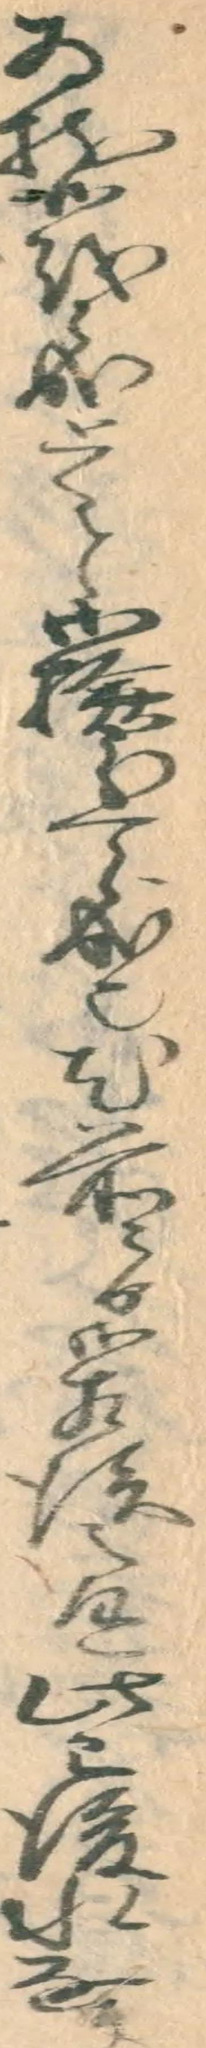為持御越被成とくと御検分可被成也尤前々ゟ御相談之通此已後水懸り
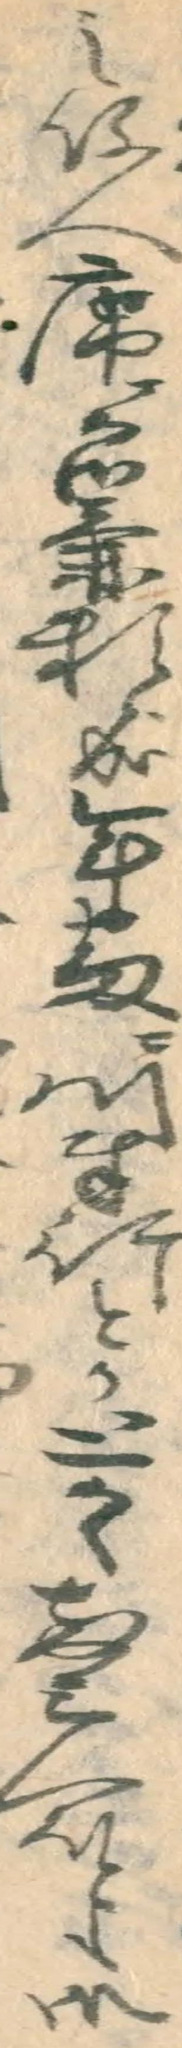之役人席ニ而御兼頼被成年番ニ川奉行とかとかく両三人ほとも御
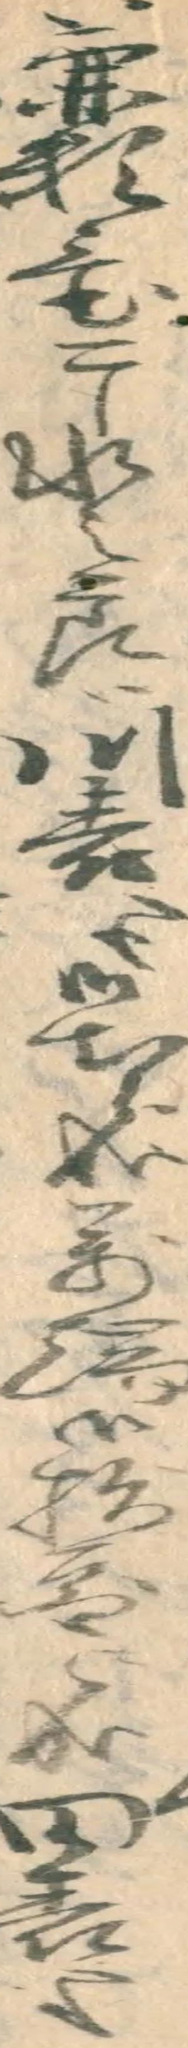兼頼置干水之節ハ川表へも御出被成万端御指図ニ被成田表へも
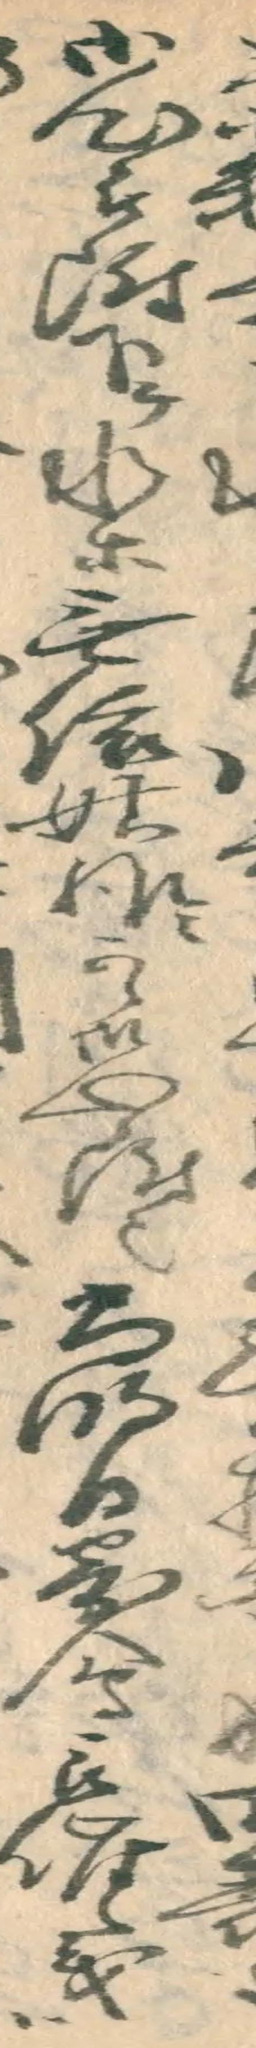御心被付下ケ水等無依姑様ニ可被御心付也尚明日寄会被催候義
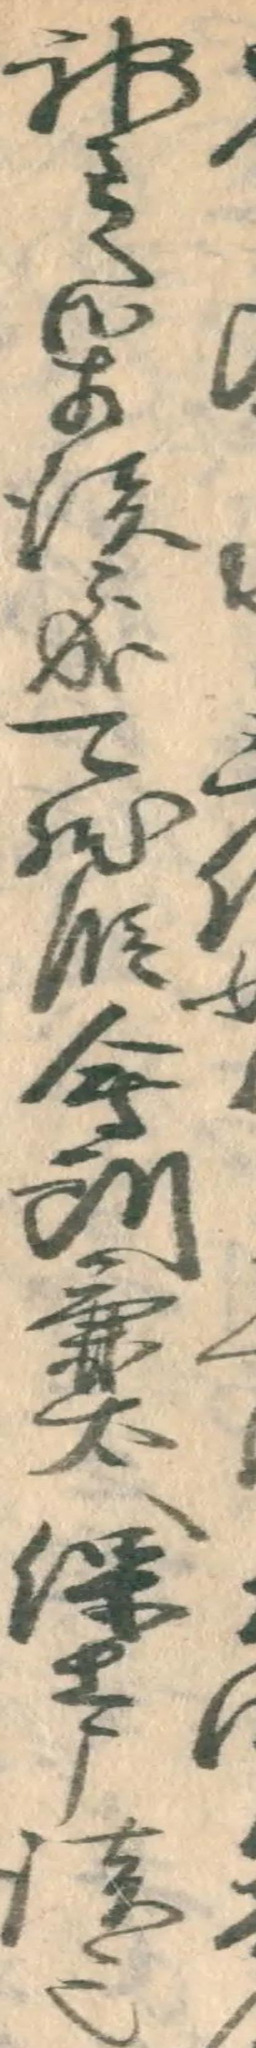神主へ御相談被成可然段会所兼太へ保土申談候也
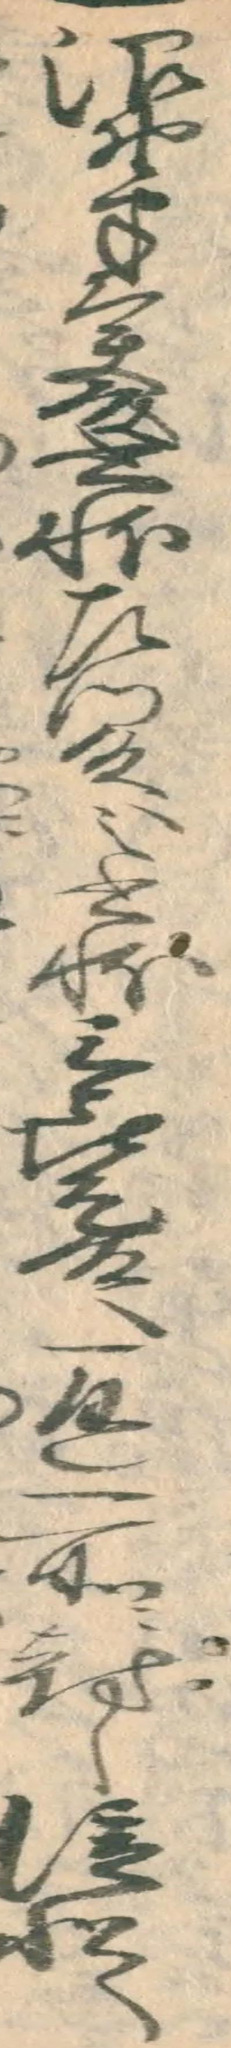一沼野半太夫殿書状左門殿へ之書状三郎允殿へ一通一所ニ封し浜松へ
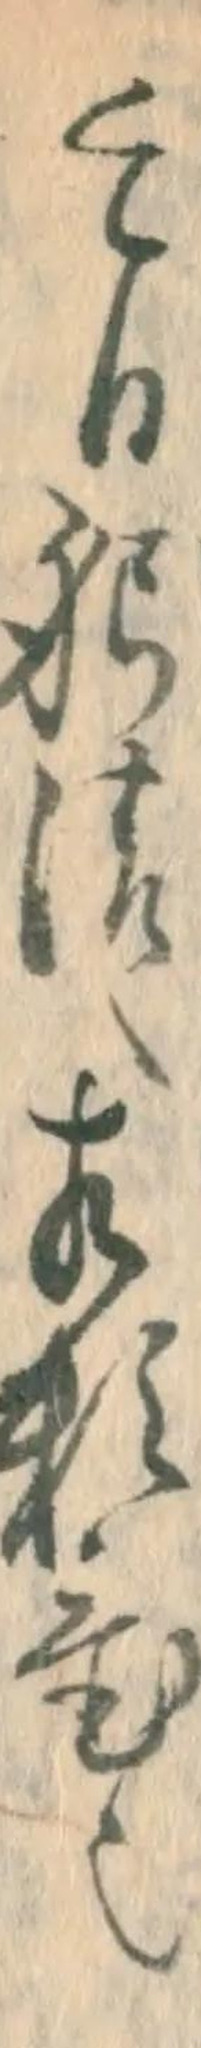今日躬清へ相頼置也
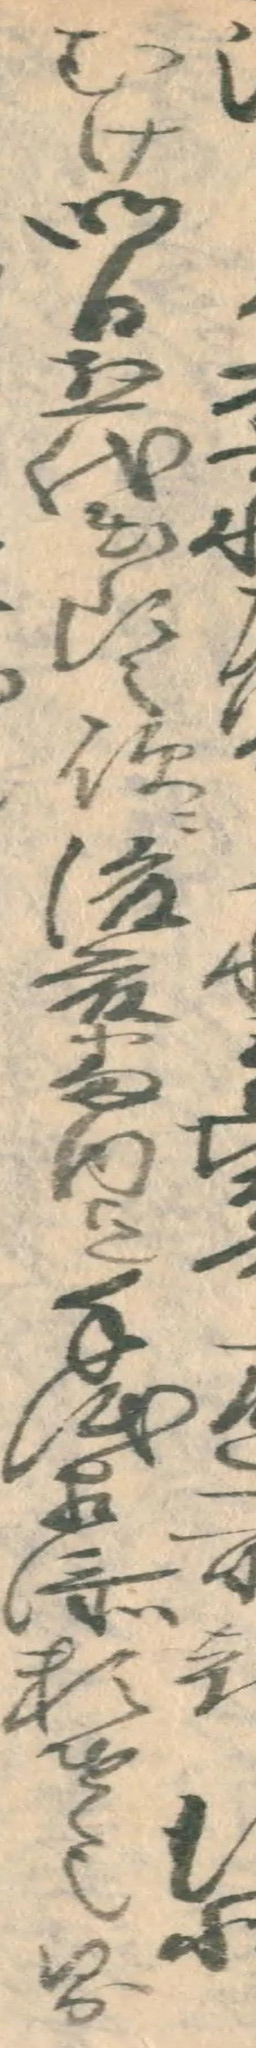むけ明日惣代出頭之便ニ後藤番内迄手紙相添頼遣候也則
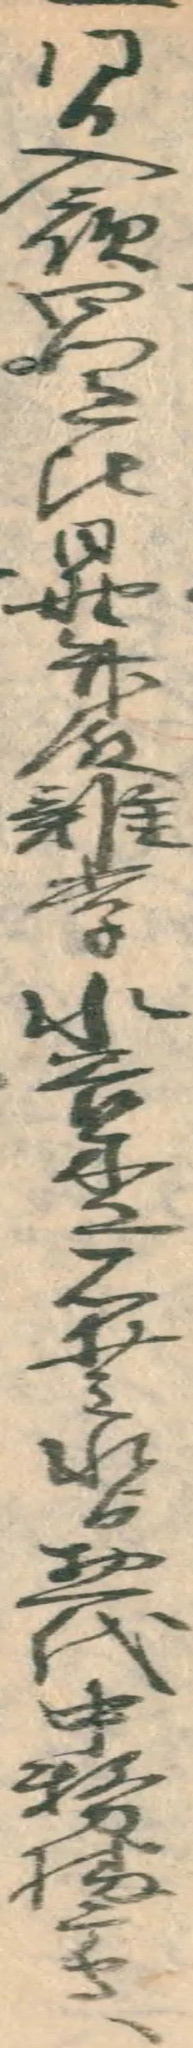一同日入夜四つ過比日野弁殿雑掌水谷木工石井主水ゟ惣代中務播磨守へ
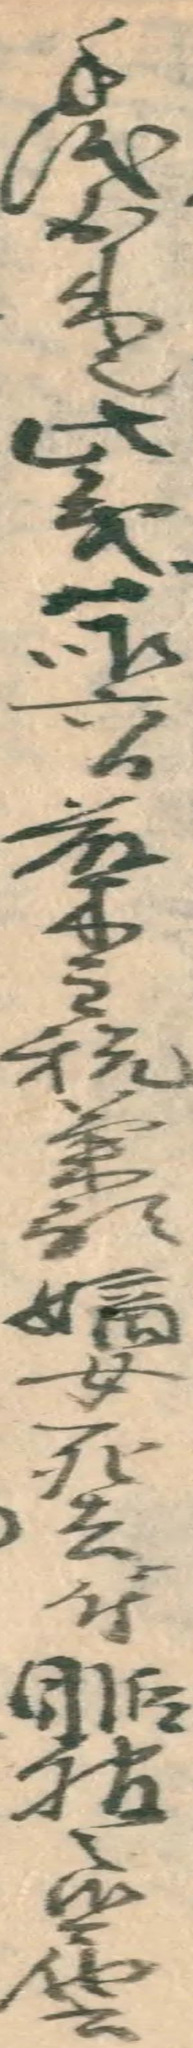手紙到来也此義ハ一昨六日藤木主税菊顕嫡女死去ニ付暇服之御届書
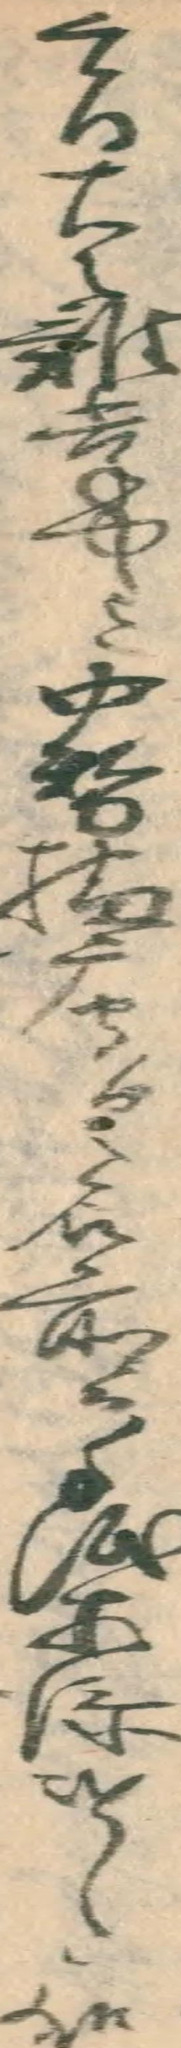今日右之雑掌中迄中務播磨守ゟ之名前ニ而手紙相添遣し候処
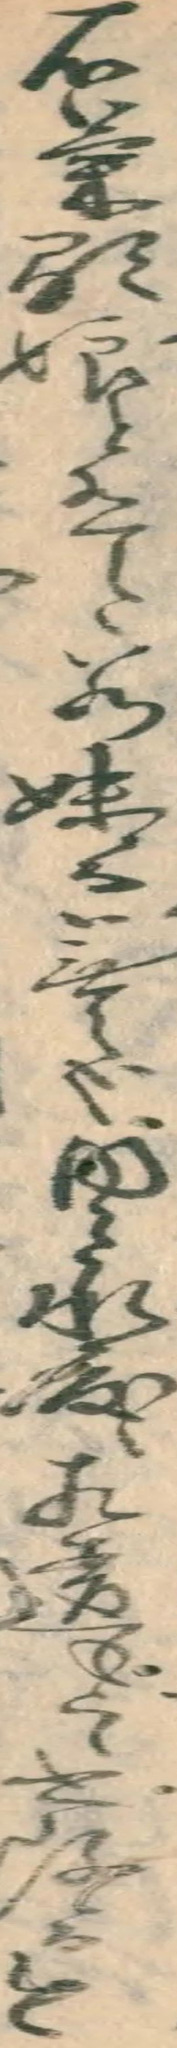右菊顕娘と有之候若妹ニ而ハ無之哉内々承度候相違も候ハヽ書改候而今
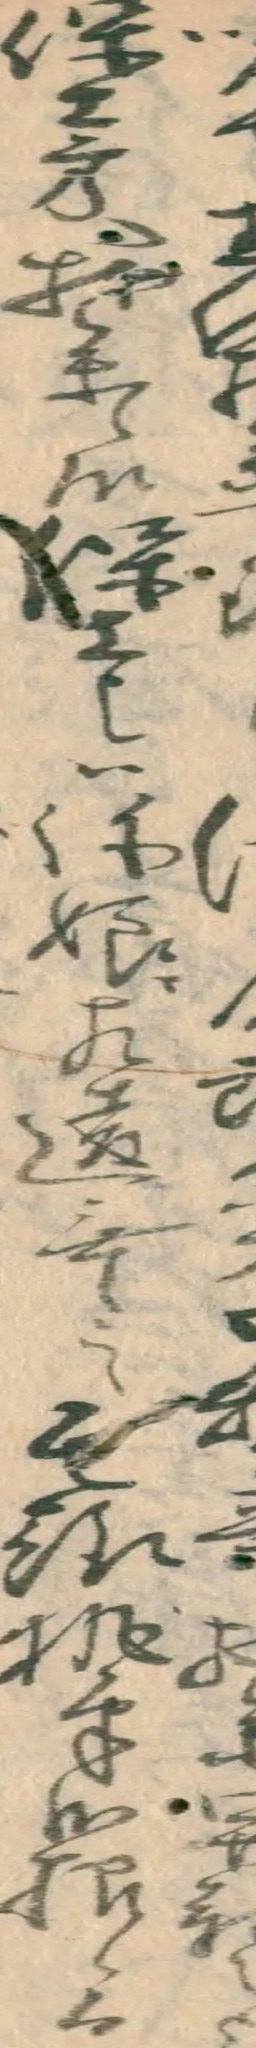保土方へ持参候故保土申候ハ弥娘ニ相違無之候ハヽ其趣執筆御招候而
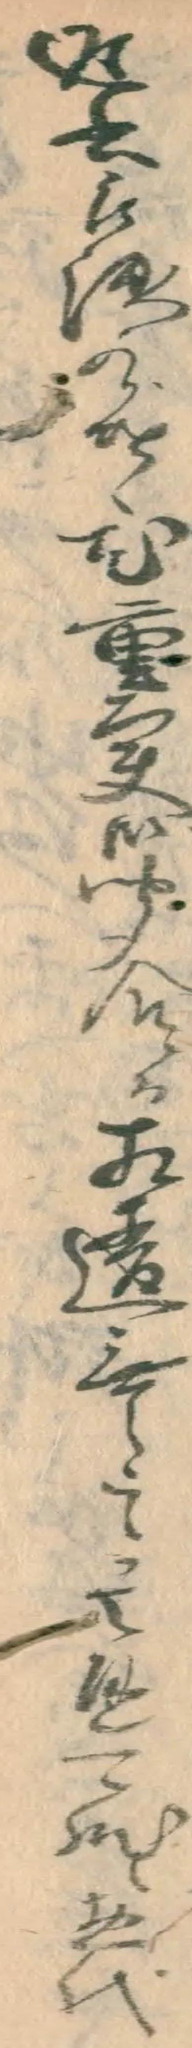返書被認可被遣候尤重大夫御聞合候而相違無之候ハヽ其通可然候惣代
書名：賀茂社記録. 第58冊
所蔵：国立国会図書館 National Diet Library, JAPAN
